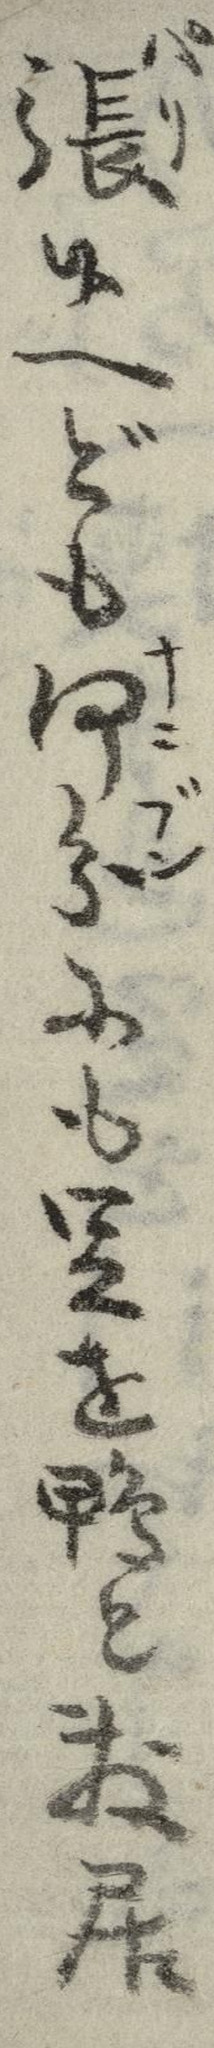張候へども何分にも足を鴨と敷居

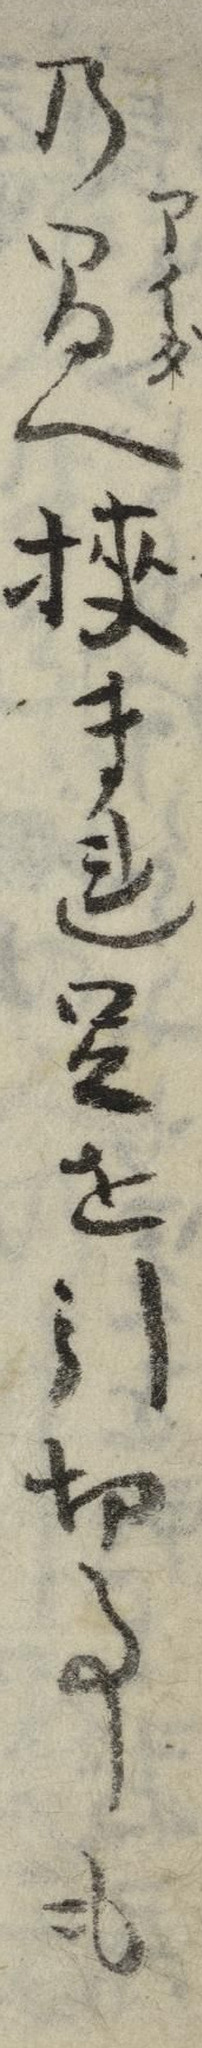乃間へ挟まれ足を引切事も
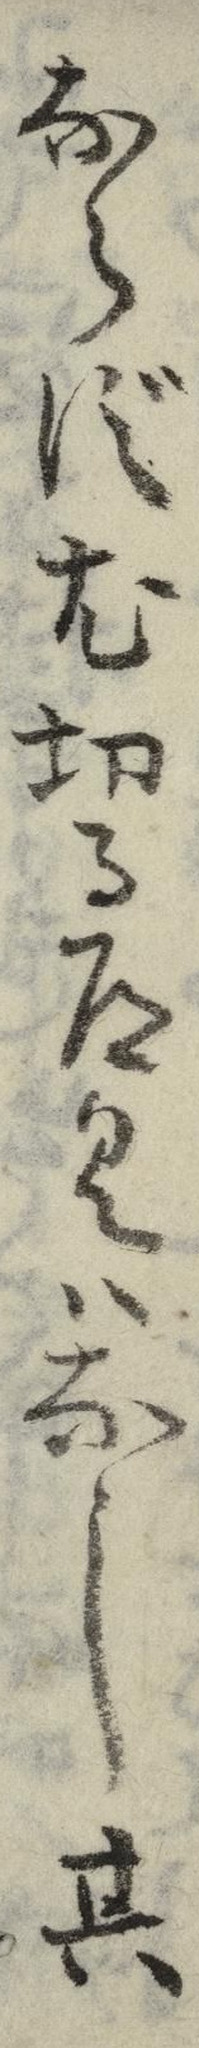ならず尤切る道具ハなし其
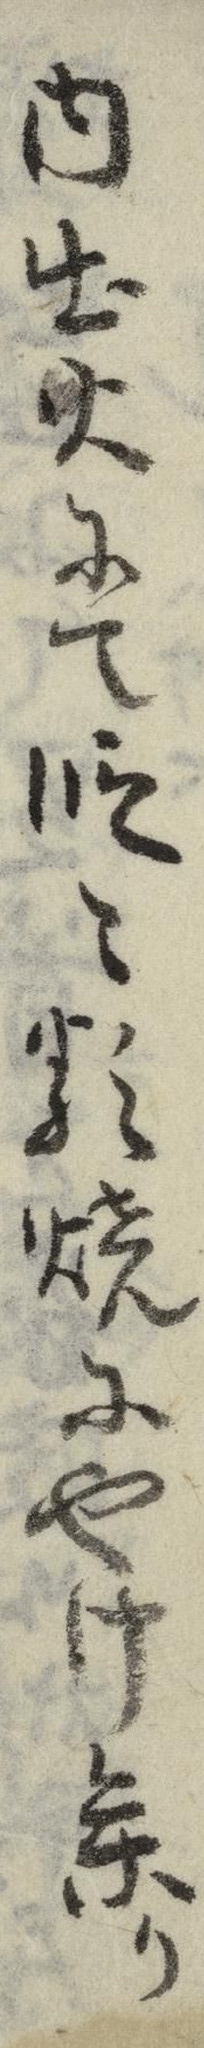内出火にて段々類焼にやけ参り
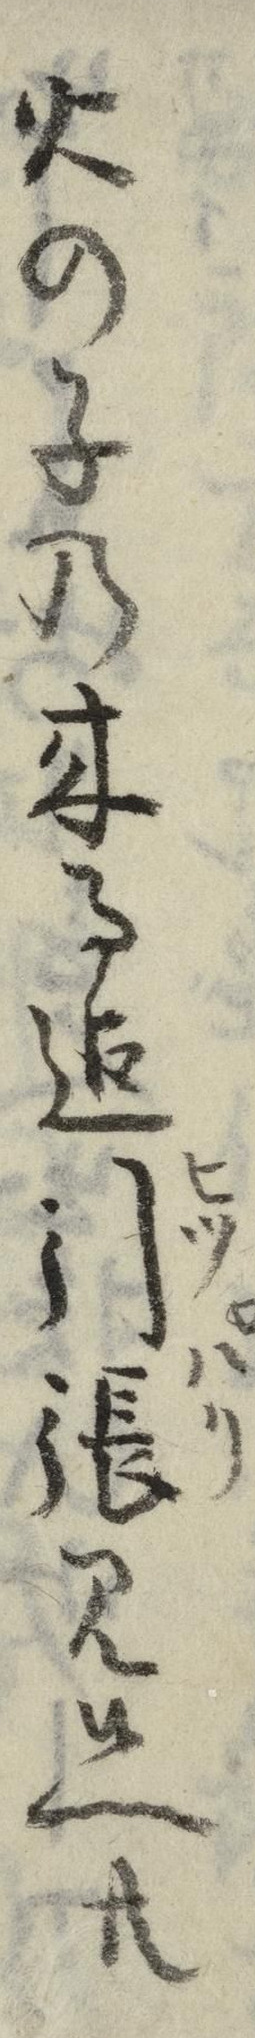火の子乃来る迄引張見候へ共
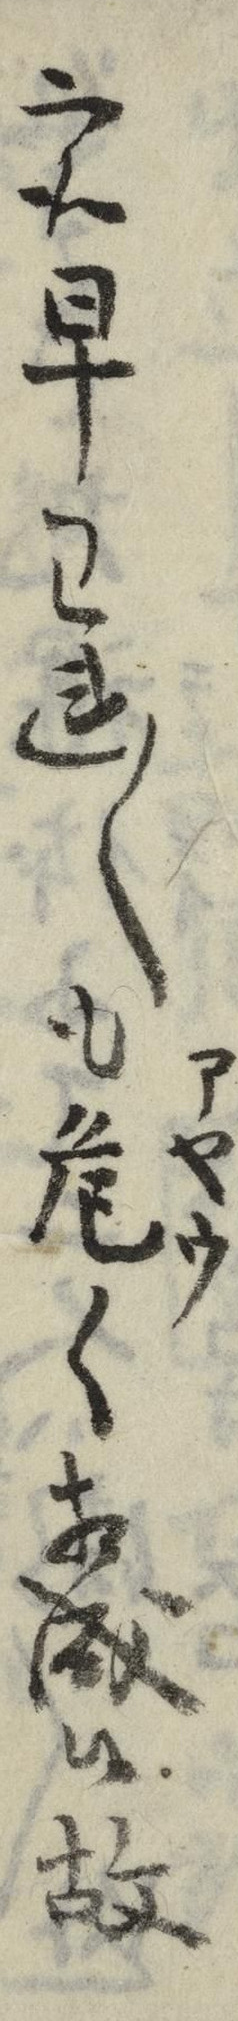最早われ〳〵も危く相成候故
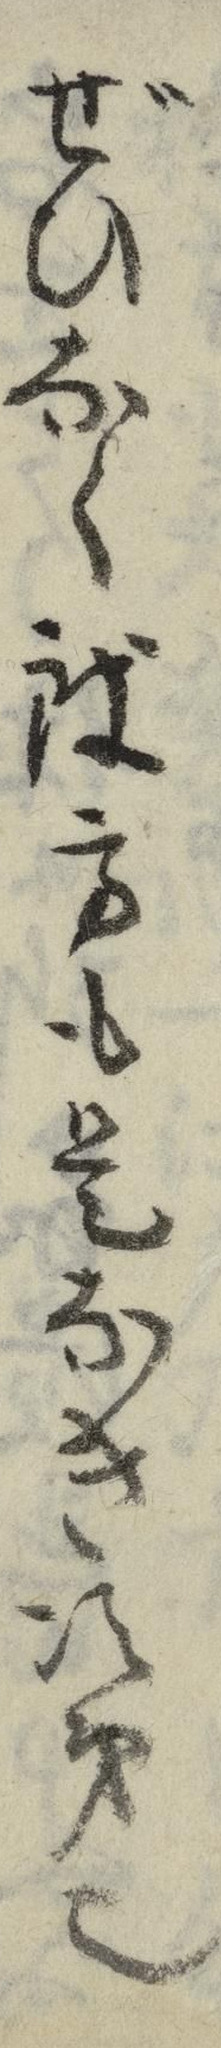ぜひなく致方も是なき次第也
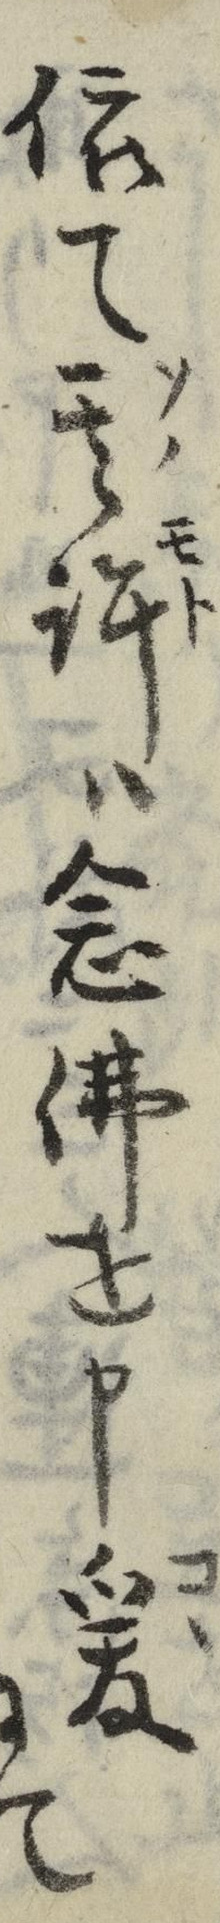依て其許ハ念仏を申爰にて
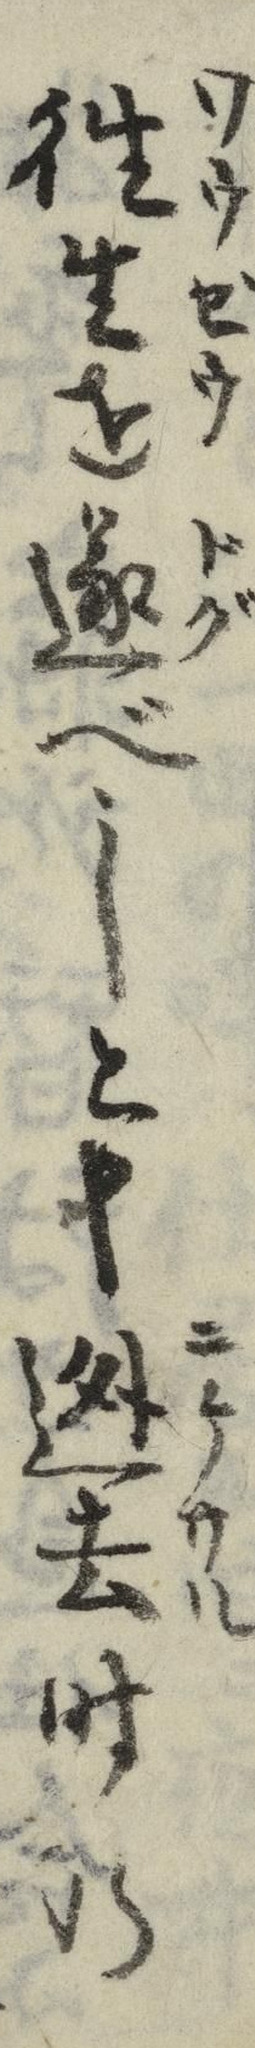往生を遂べしと申逃去時乃
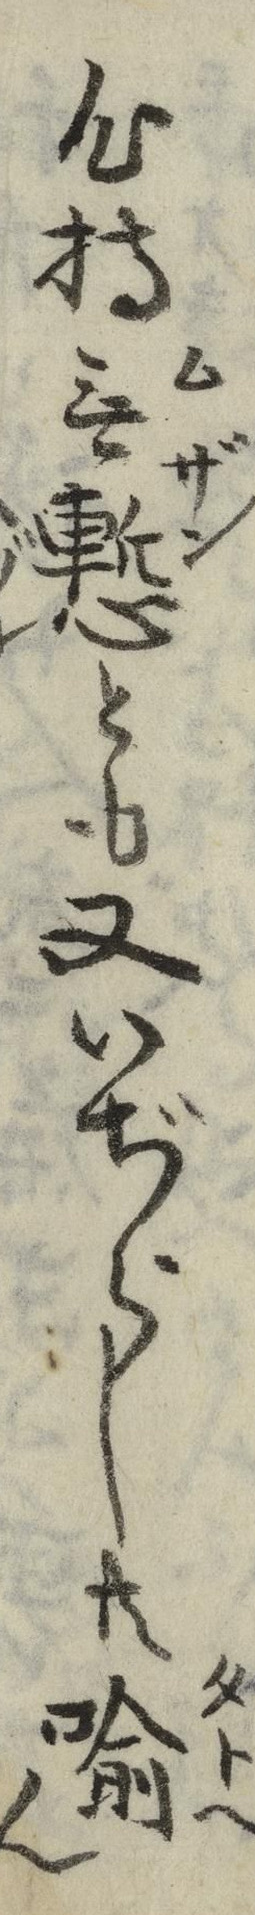心持無慙とも又いぢらし共喩ん
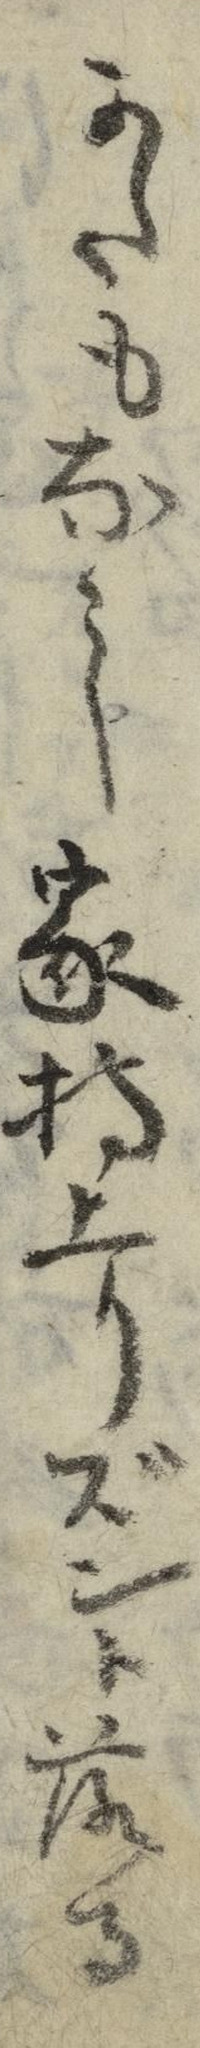かたもなし家持上りズント落る
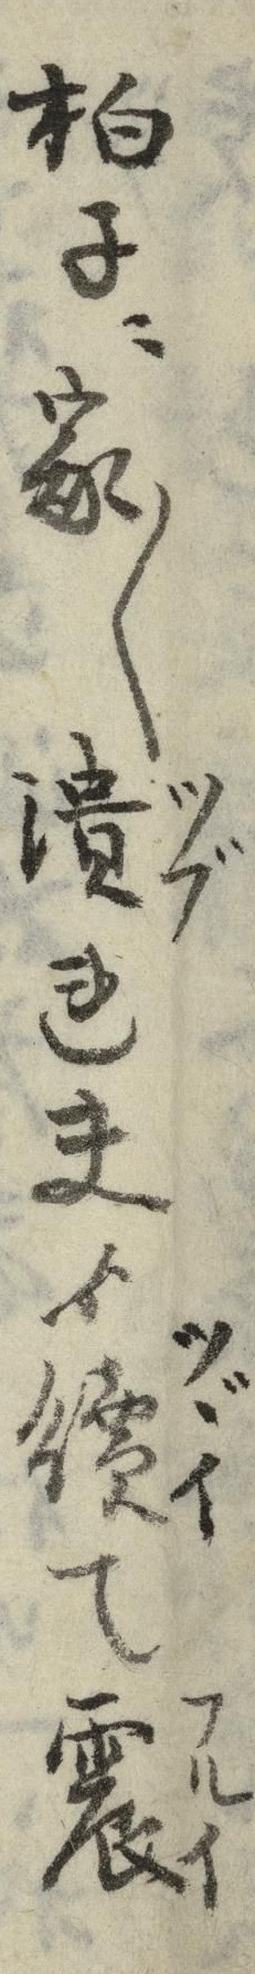拍子二家〳〵潰れ夫ゟ続て震
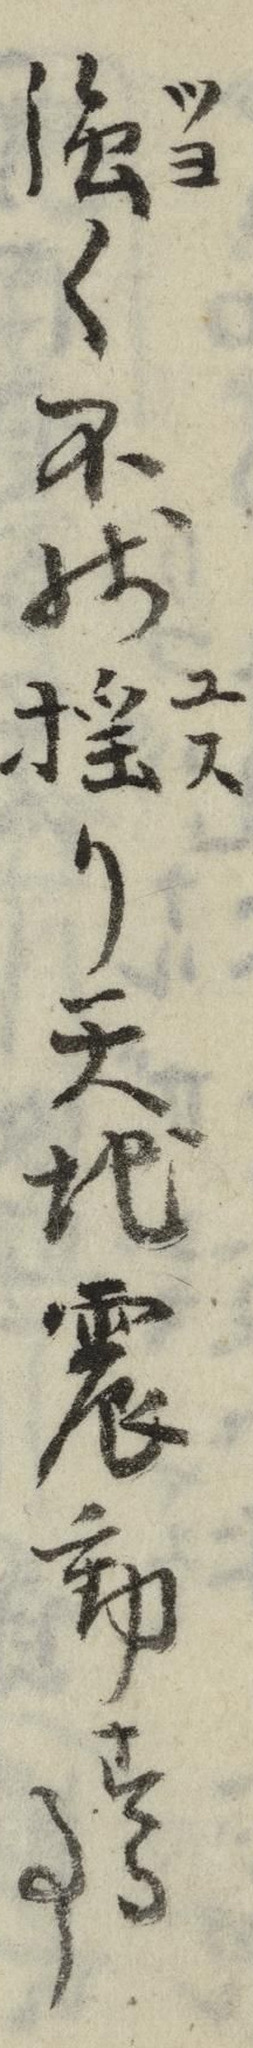強く不残揺り天地震動する事
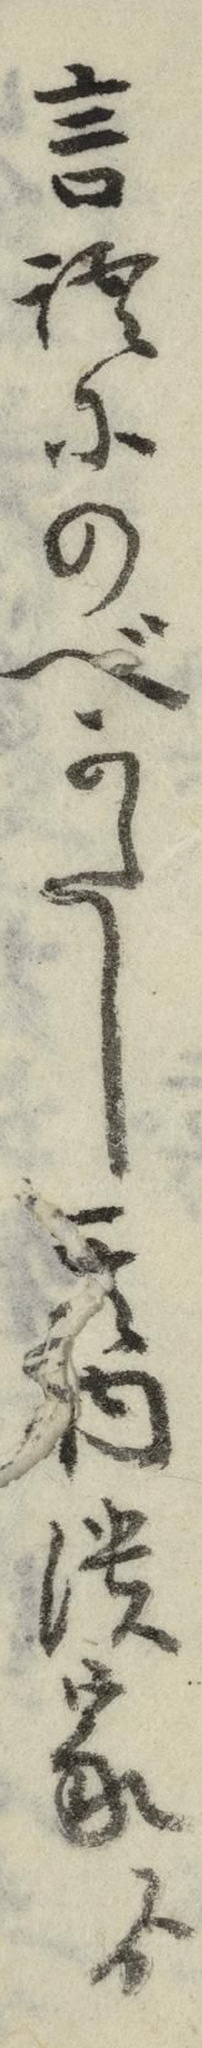言語にのべかたし其内潰家ゟ
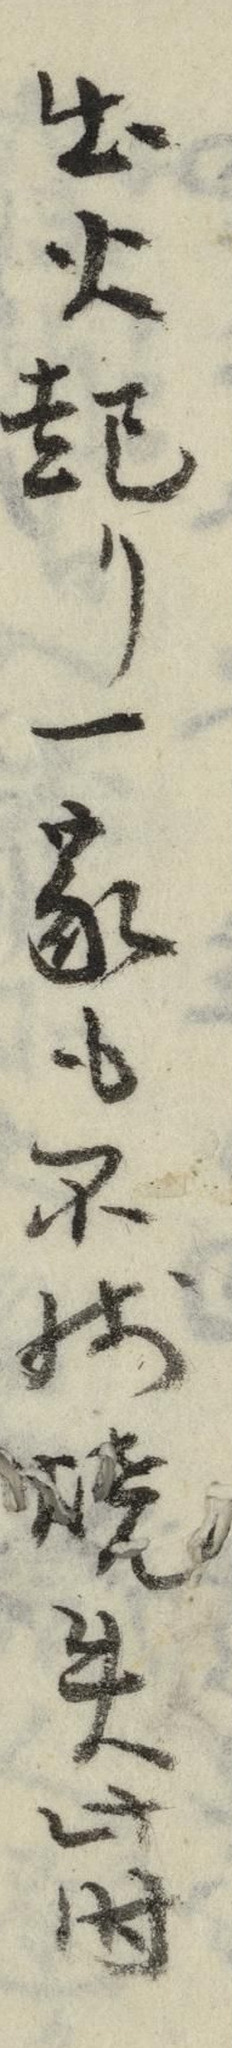出火起り一家も不残焼失此時
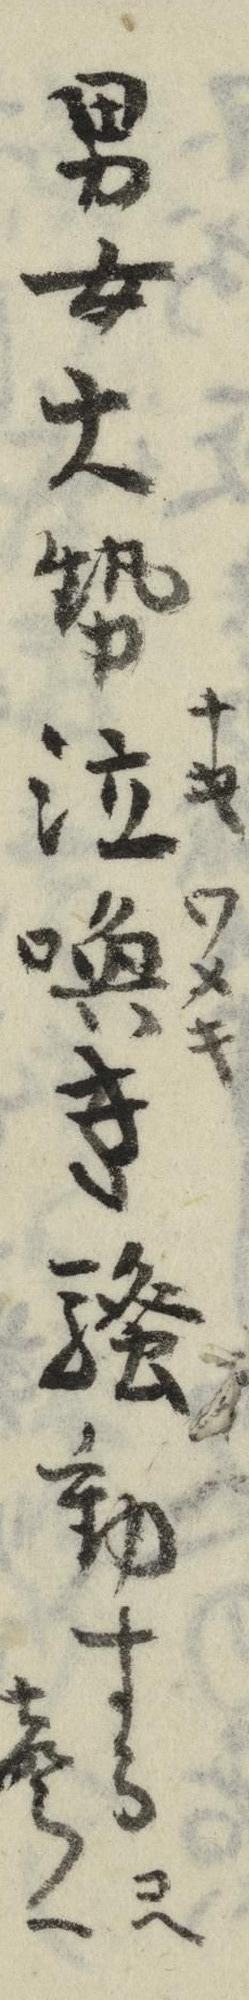男女大勢泣喚き騒動する声へ
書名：信州大地震一件之冩　丁未弘化四年三月吉日
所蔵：東京大学地震研究所図書室 Earthquake Research Institute Library, The University of Tokyo, JAPAN
